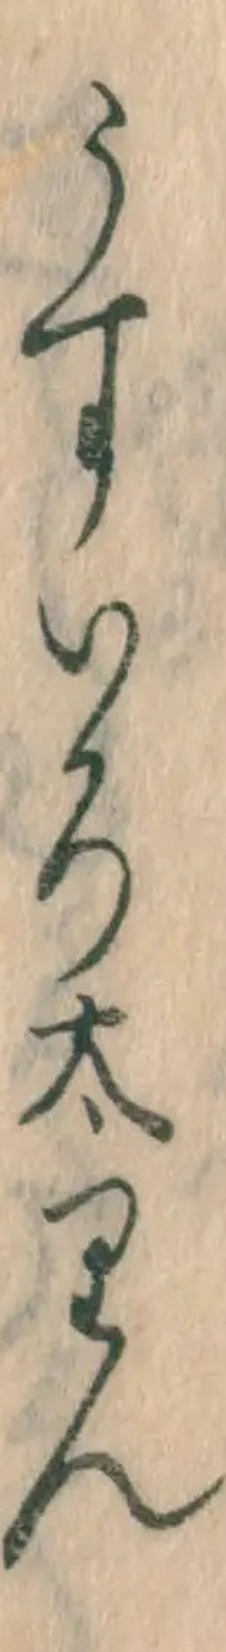うすいろ太りん
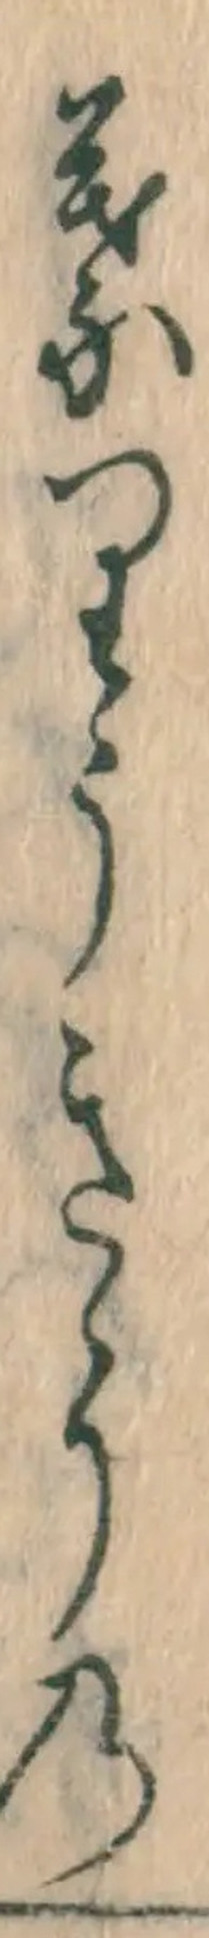葉りうきうの

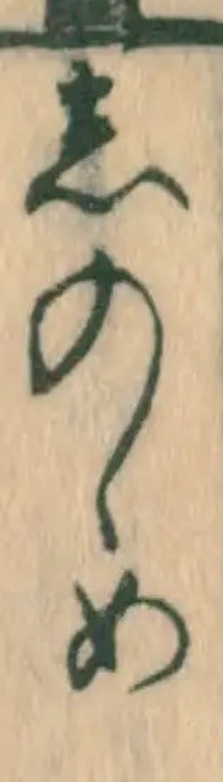しのゝめ
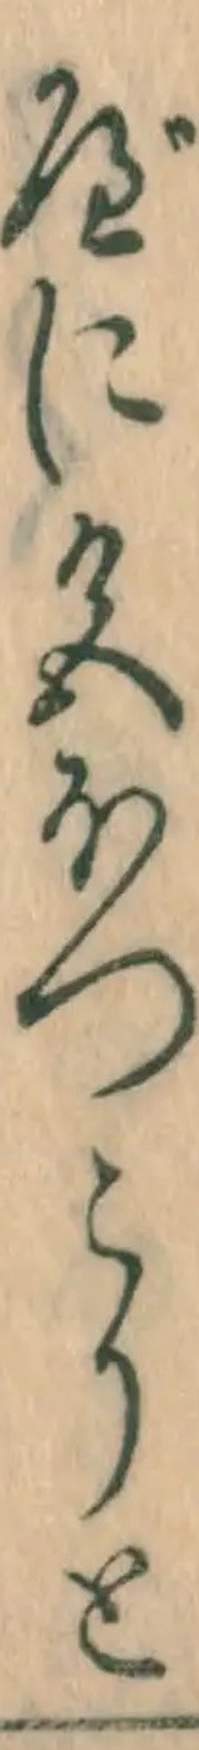べに色ほつこりと
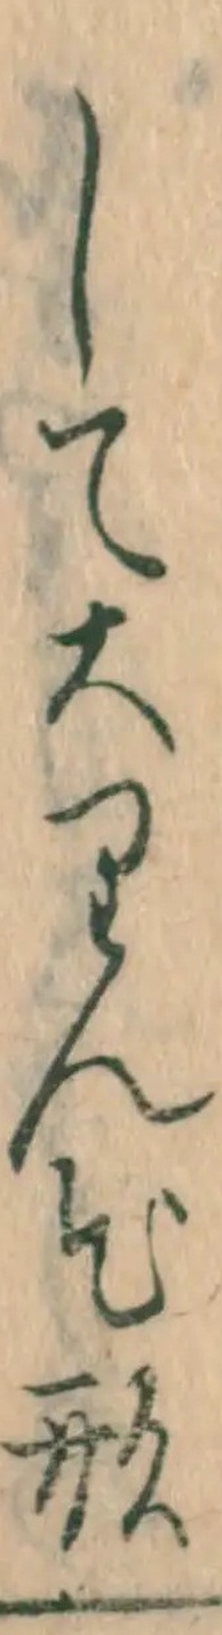して大りん花形
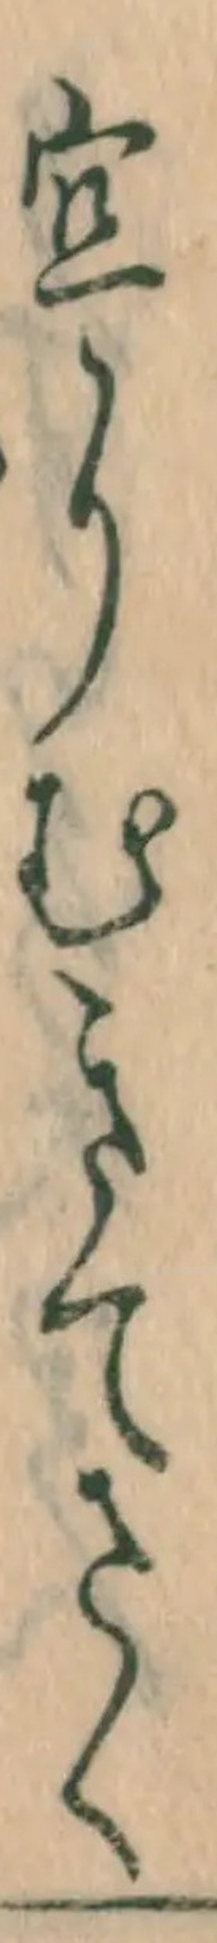空にむきてさく
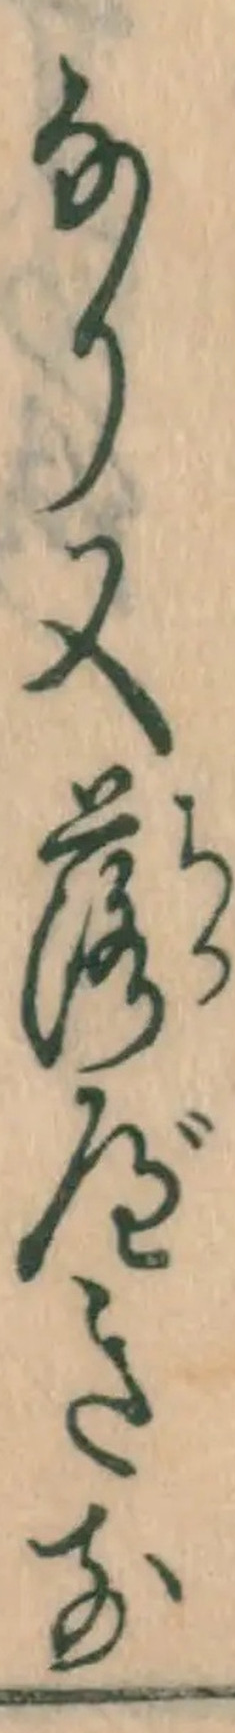なり又落べき前
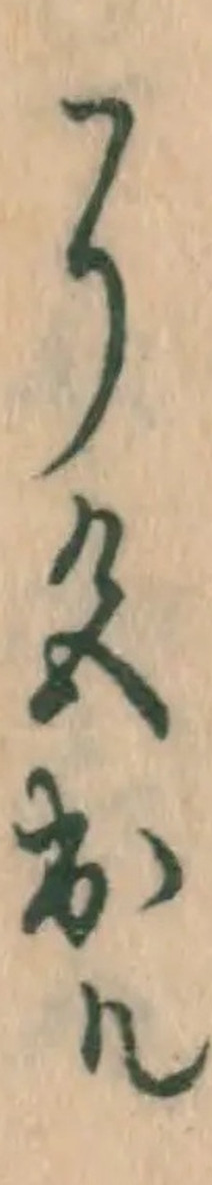に色出る
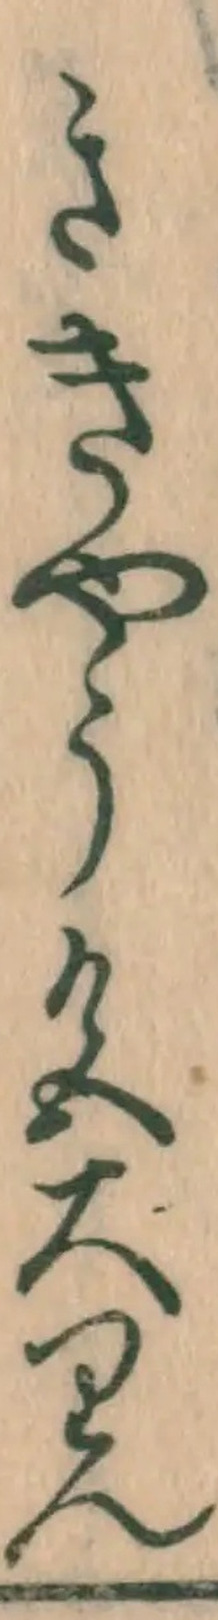ききやう色大りん
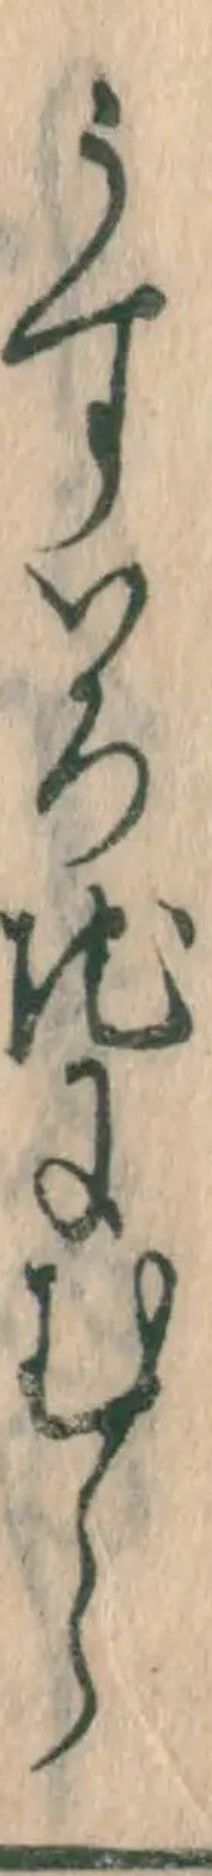うすいろ地にむら
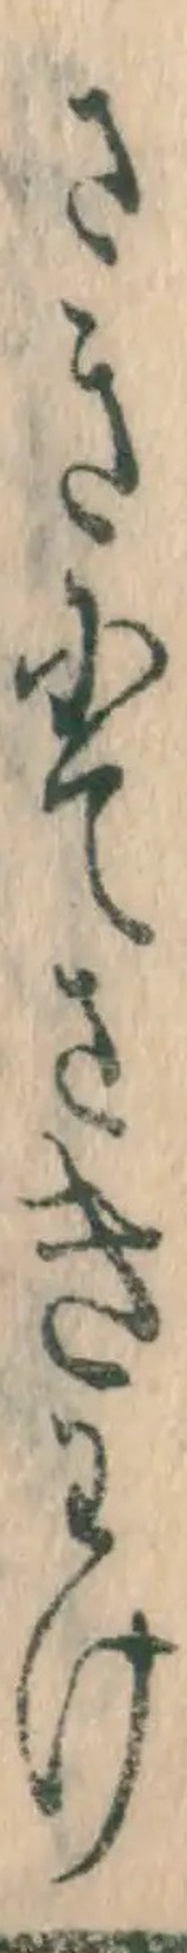さきにてさきわけ

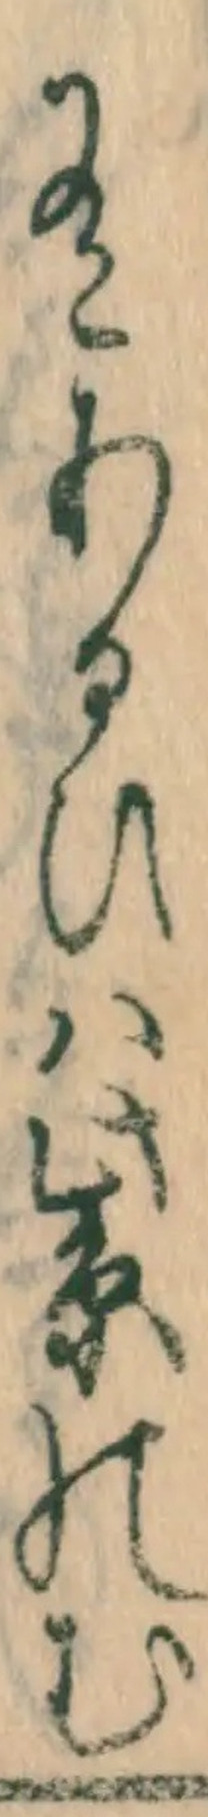有あるひは紫のむ
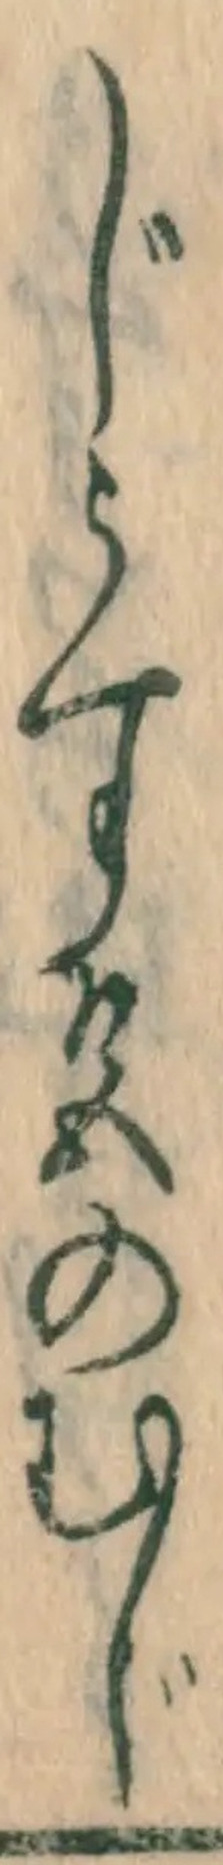じうす色のむじ
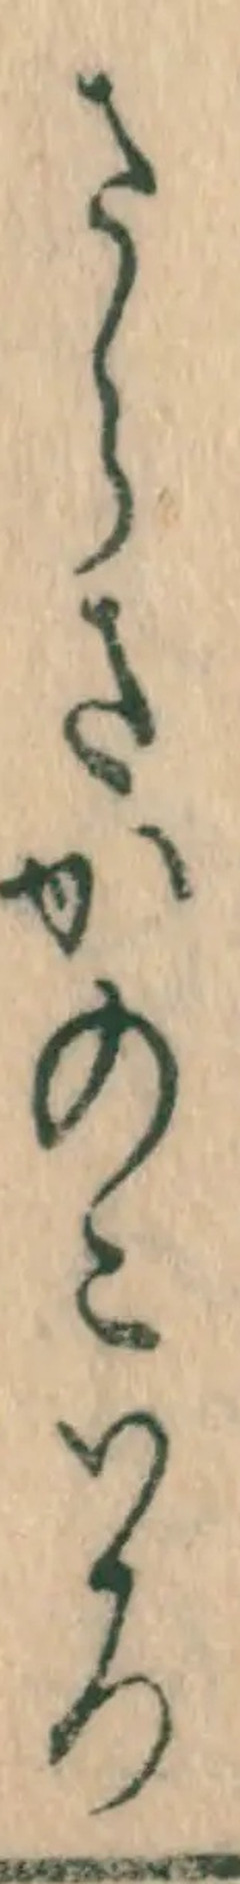さらさかのこいろ
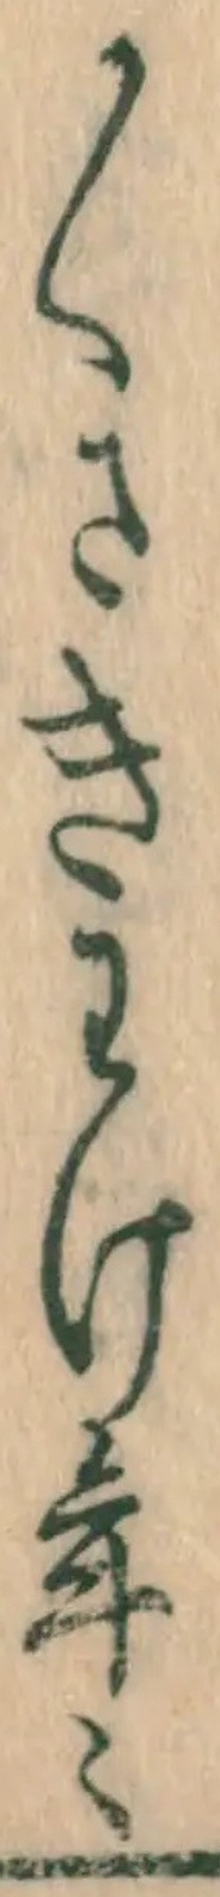〳〵さきわけ年に
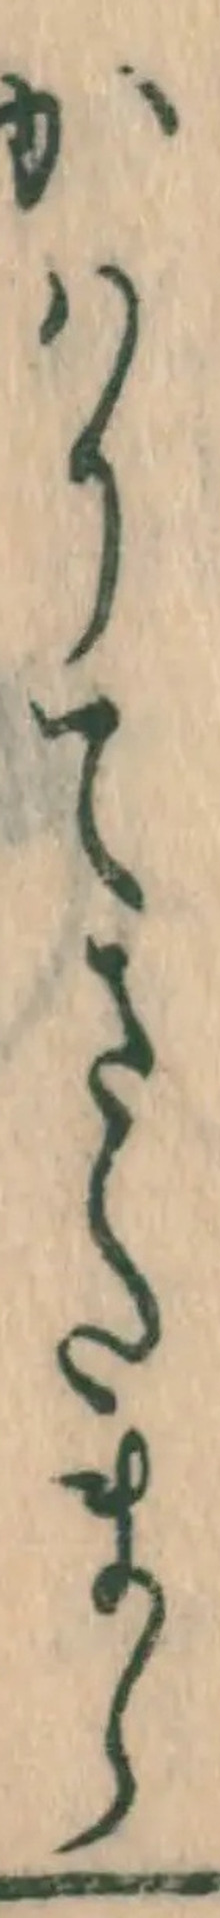かはりてさたまら
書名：錦繍枕 5巻. [3]
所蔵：国立国会図書館 National Diet Library, JAPAN
